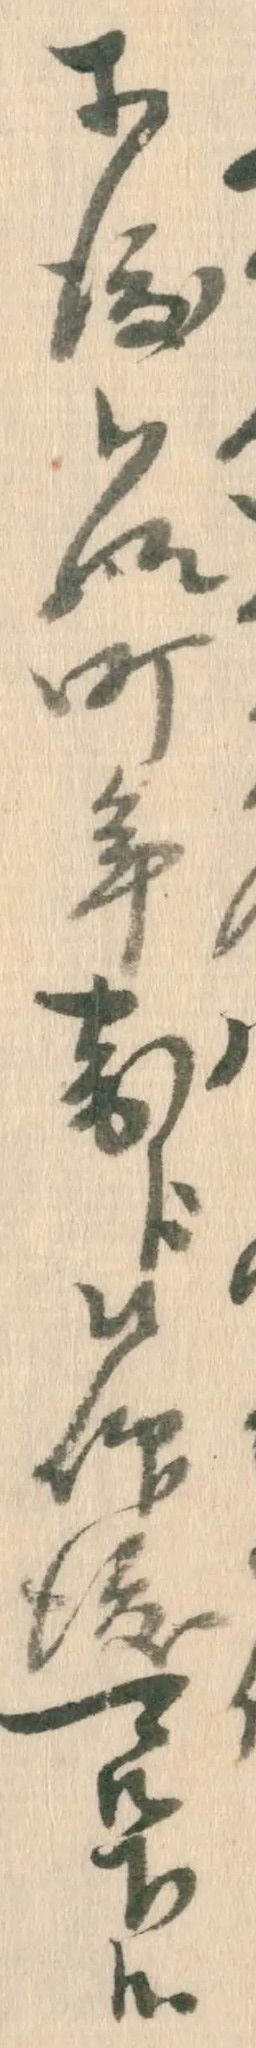相渡候様町年寄え被仰渡可被下候

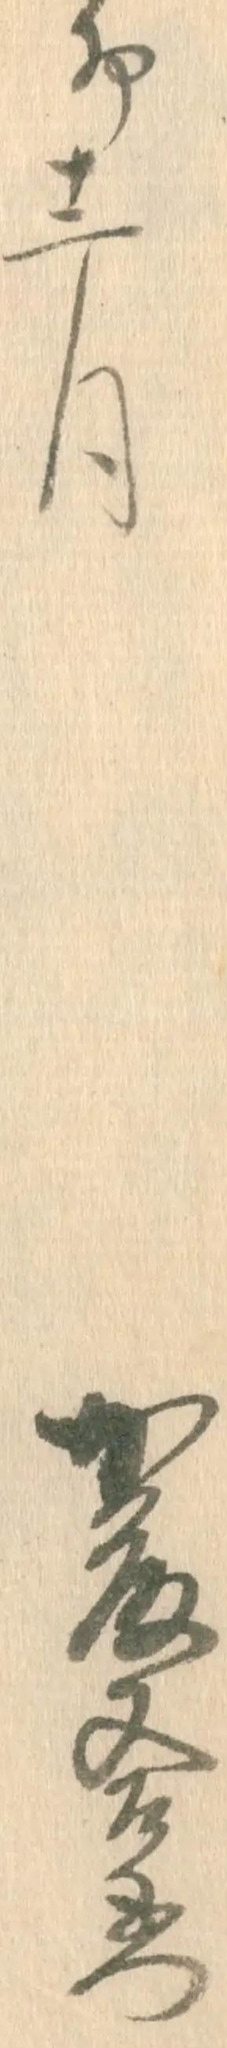卯十二月加藤又左衛門
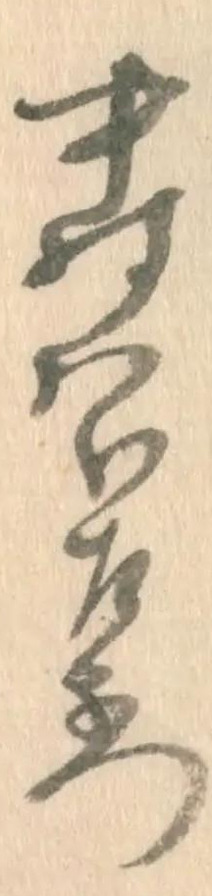中村八郎左衛門
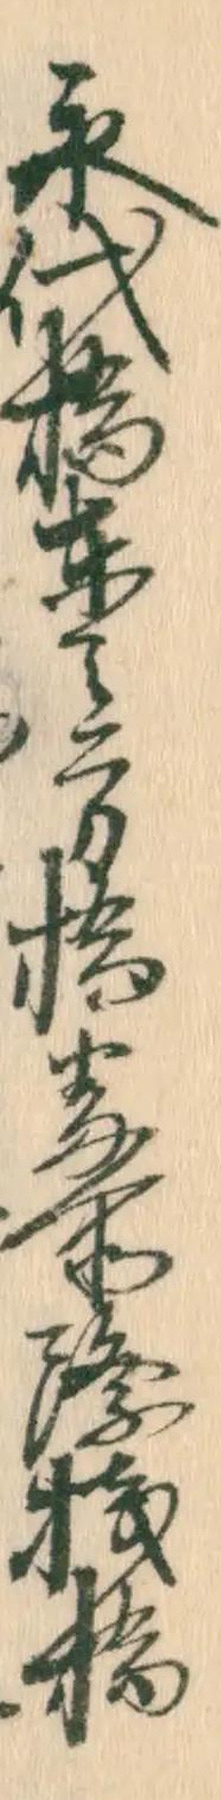永代橋東之方橋番所際桟橋
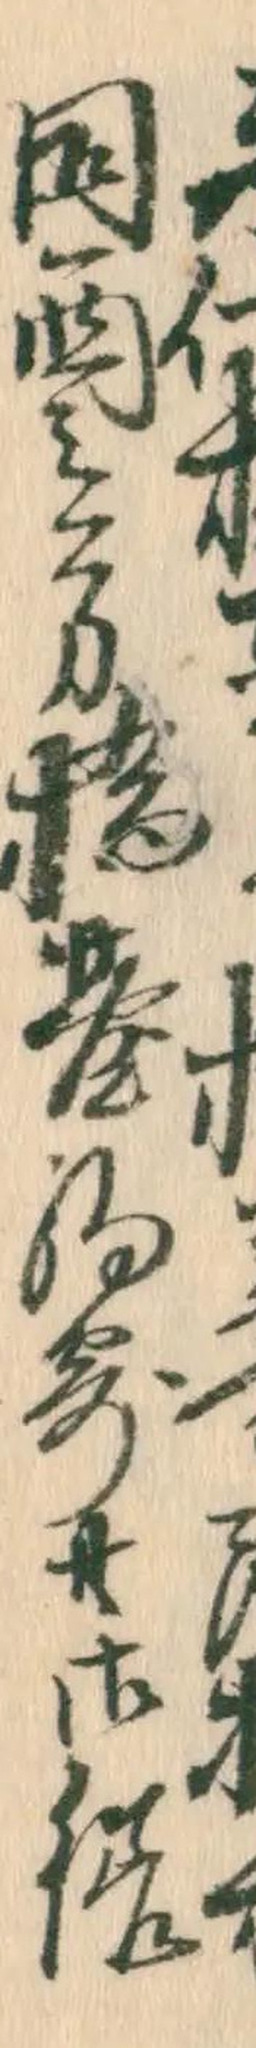同西之方橋台駒寄共御繕
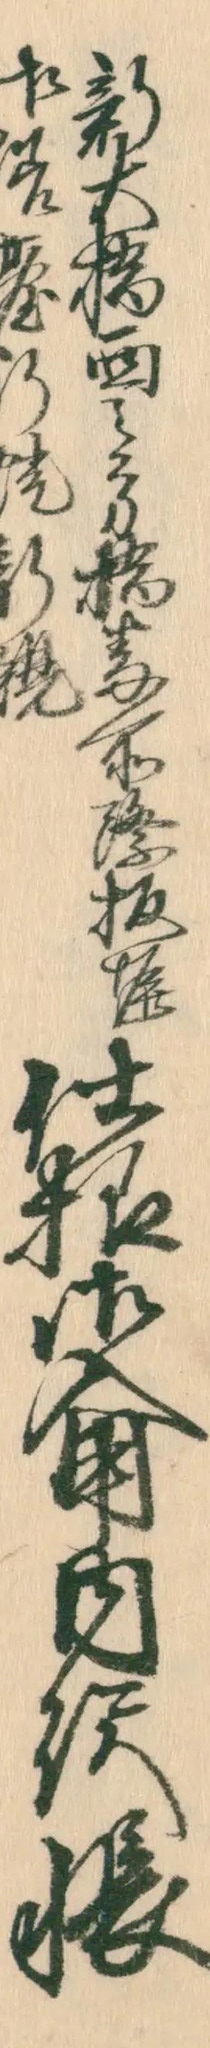新大橋西之方橋番所際板塀仕様御入用内訳帳
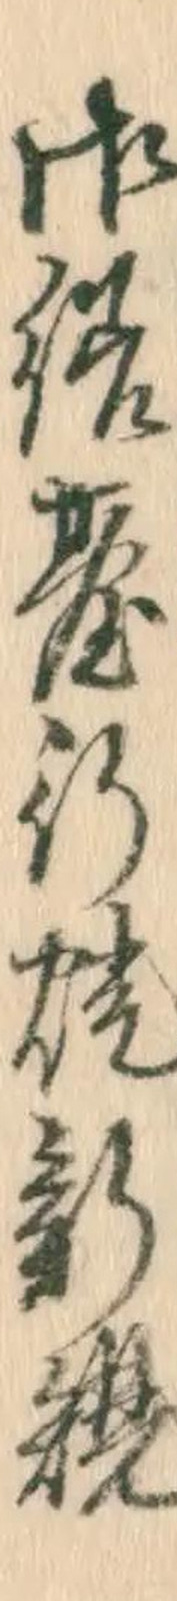御繕台行灯新規
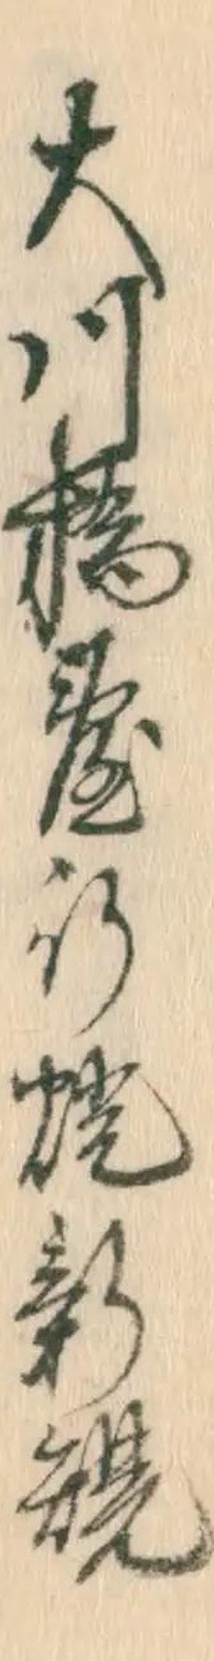大川橋台行灯新規
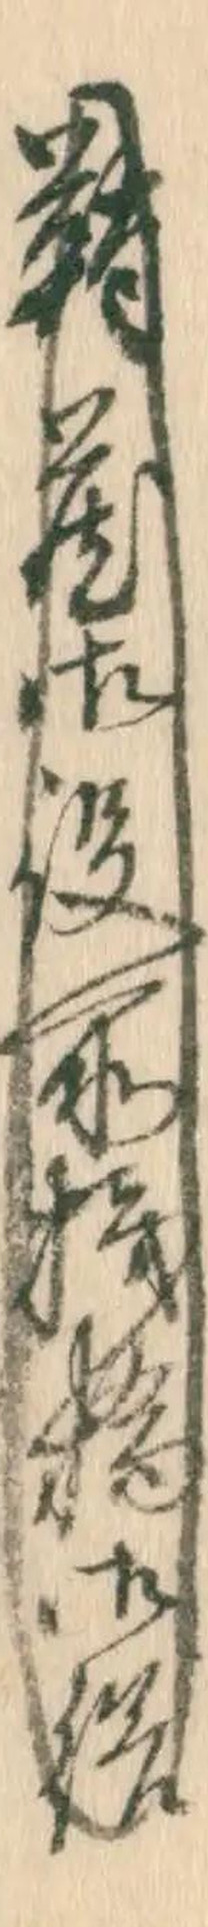「鞘蔵御役所桟橋御繕」

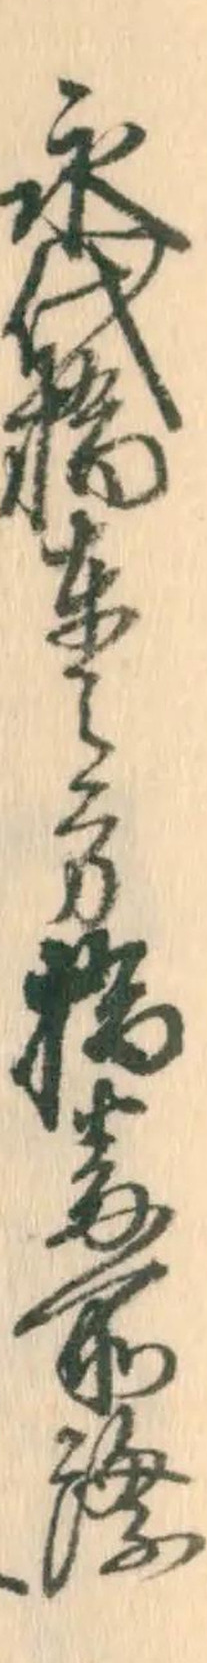永代橋東之方橋番所際
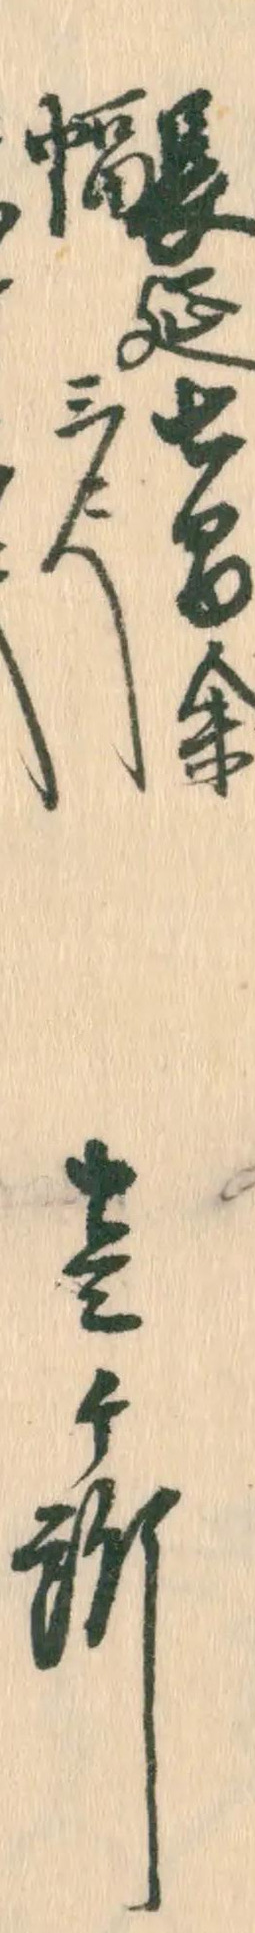巾三尺壱ケ所
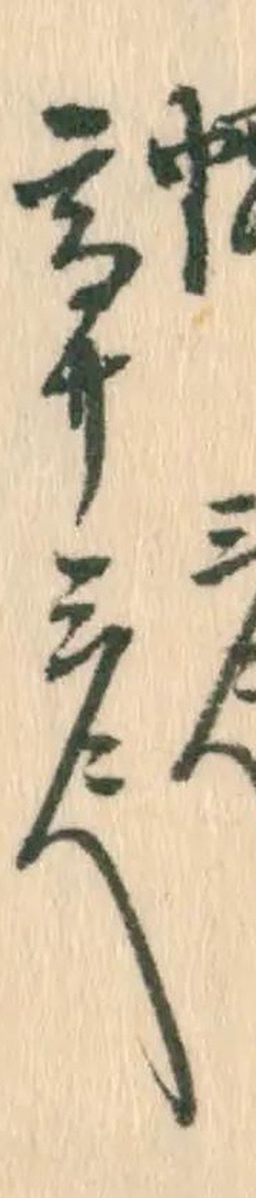高サ三尺
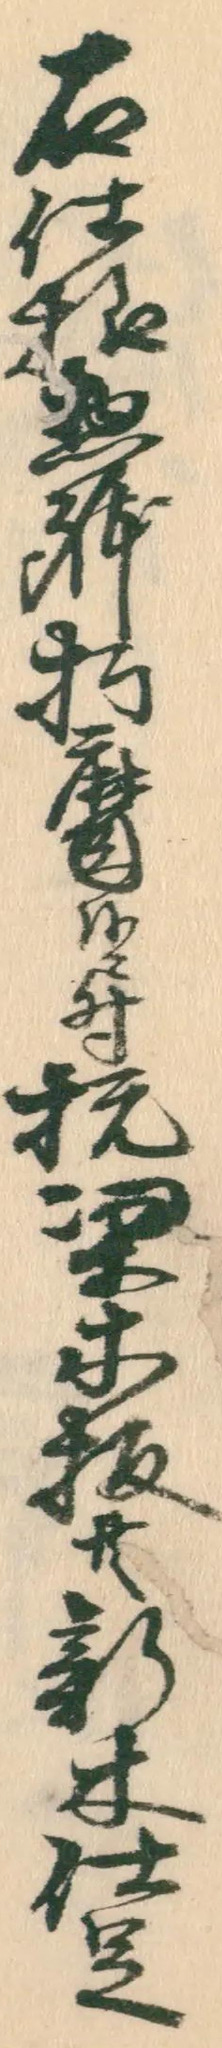右仕様惣体朽腐候ニ付杭梁木板共新木仕足
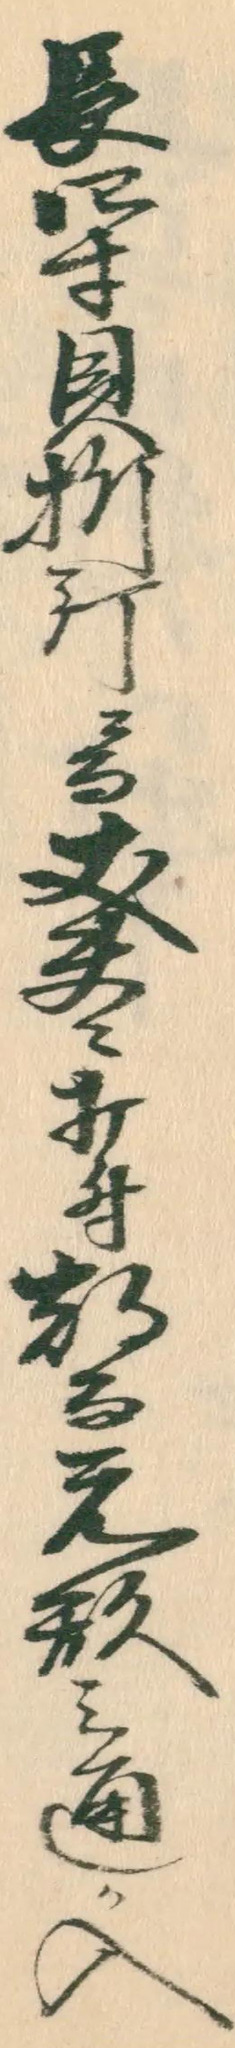長四寸貝折釘ニ而丈夫ニ打付都而元形之通り入
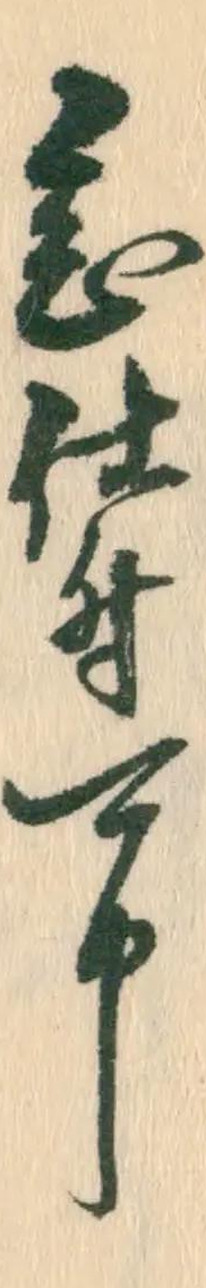念仕付可申
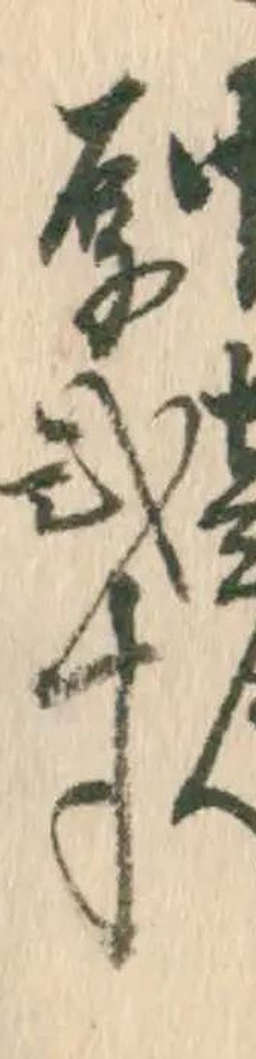厚弐寸
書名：三橋 17巻. [8] 三橋小破御修復書留　但御奉行御掛リ替地震潰橋番屋　嘉永四亥年より安政二卯年迄　下
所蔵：国立国会図書館 National Diet Library, JAPAN
